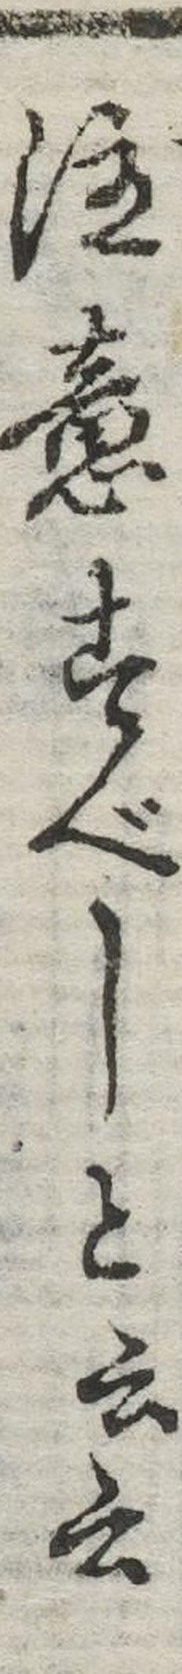注意すべしと云云

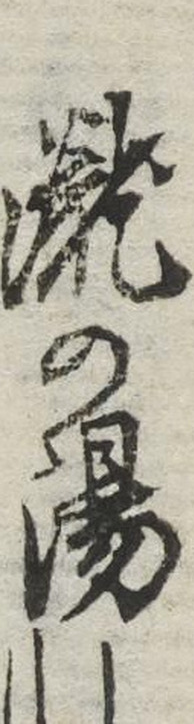瀧の湯
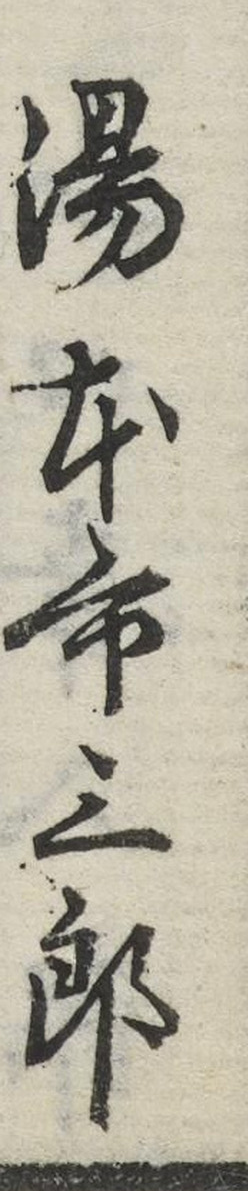湯本市三郎
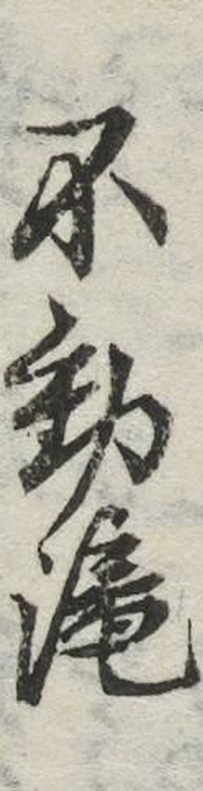不動滝
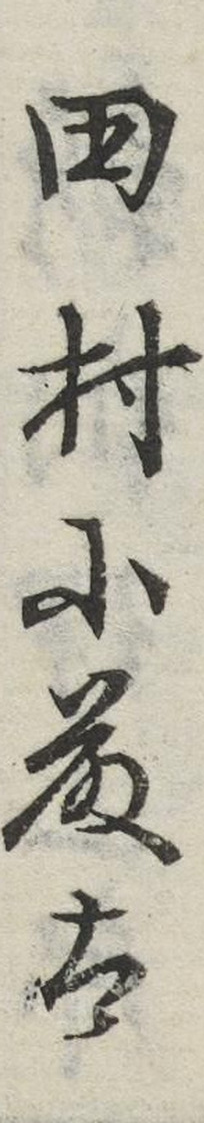田村小藤太
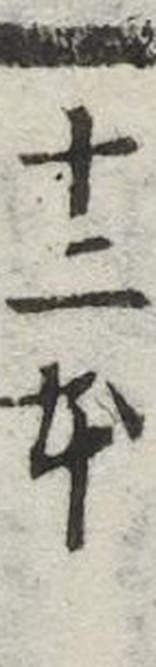十二本
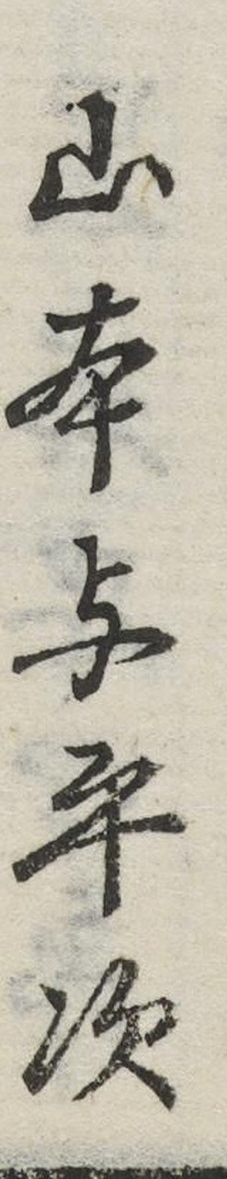山本与平次
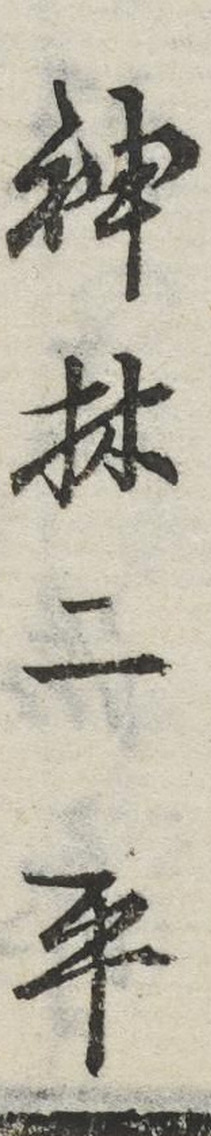神林二平
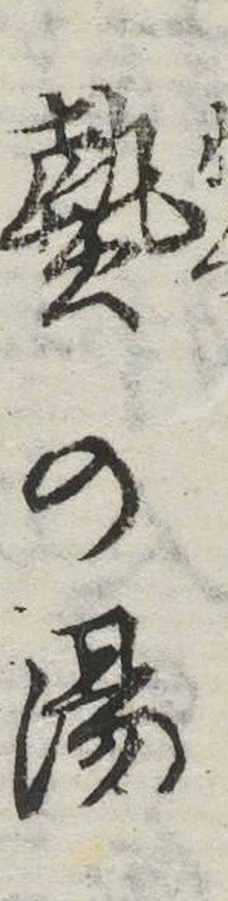熱の湯
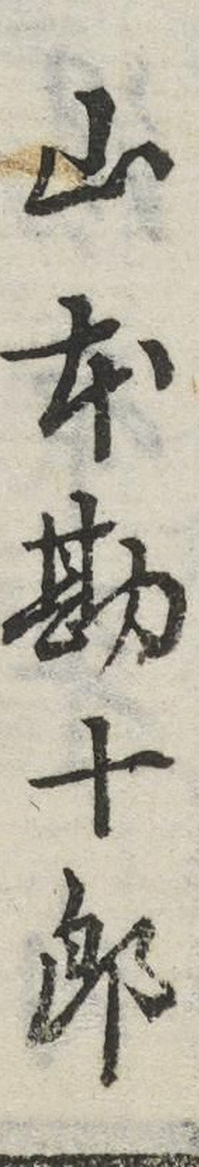山本勘十郎
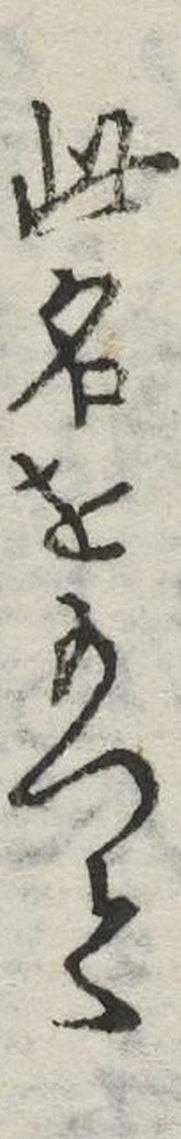此名をもつて
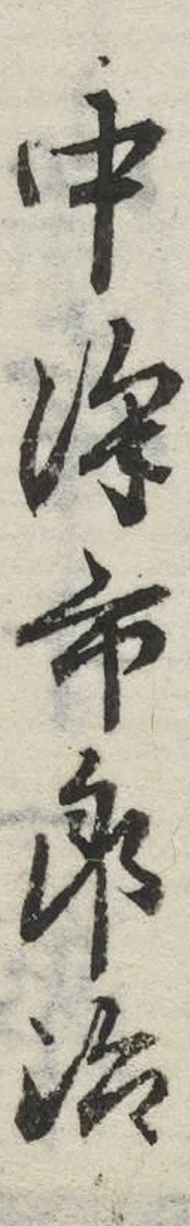中澤市郎治
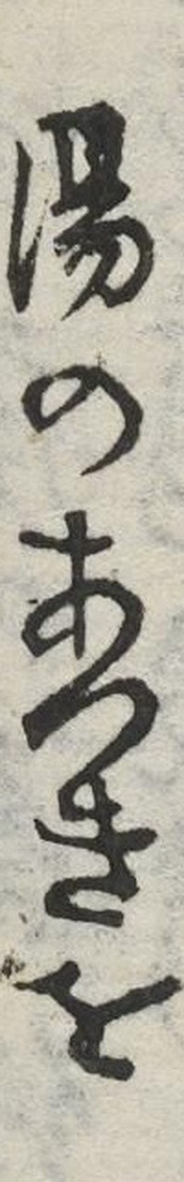湯のあつきを
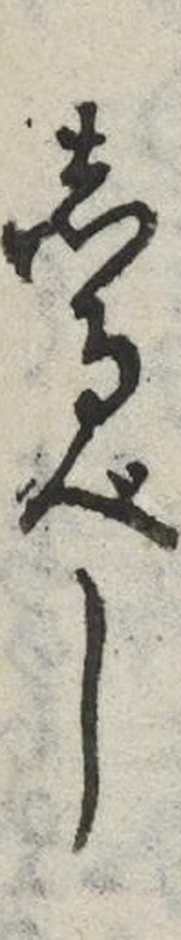しるべし
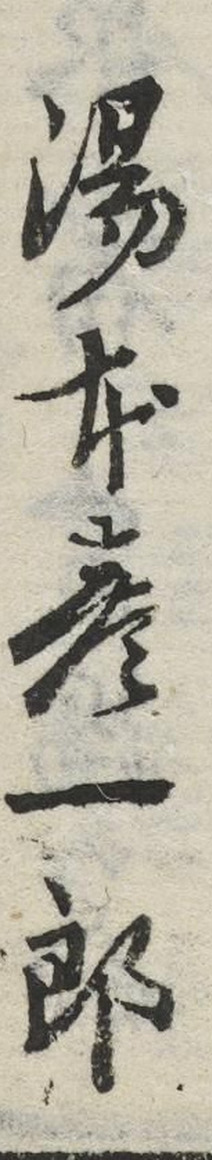湯本彦一郎
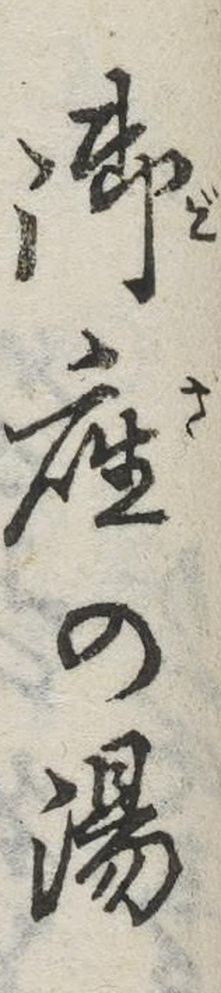御座の湯
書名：諸國温泉遊覽記　全
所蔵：東京大学地震研究所図書室 Earthquake Research Institute Library, The University of Tokyo, JAPAN
